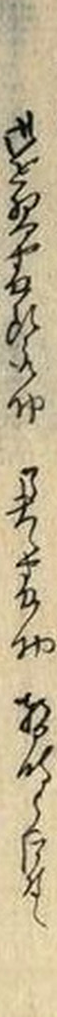御近習番頭取助奥之番助暫時被仰付候御裏役
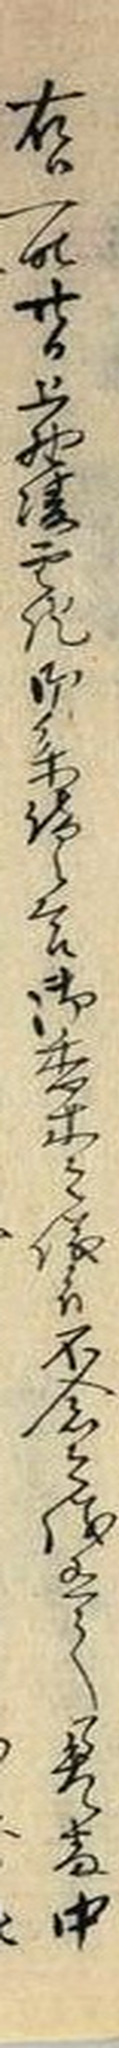右ハ一昨廿日上野凌雲院参詣之節御香木之儀ニ付不念之儀有之奥之番中
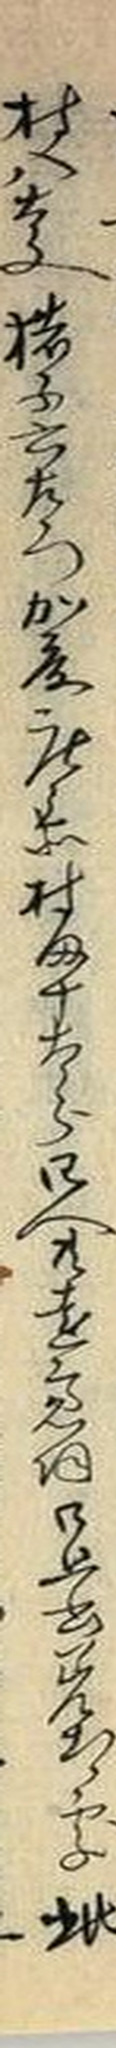村八太夫猪子六左衛門加藤庄兵衛村田十太郎四人共遠慮伺口上書差出候処此
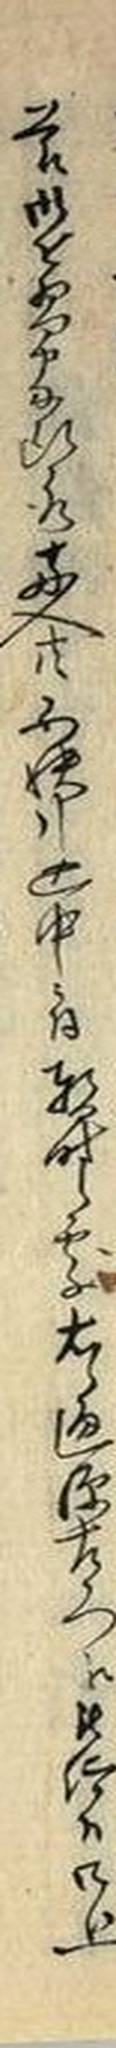節御近習番頭取両人共不快引込中ニ付暫時之処右之通源左衛門江被仰付口上
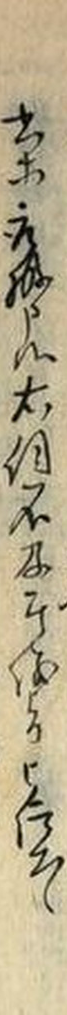書等取扱申候右伺不及其儀旨被仰出候
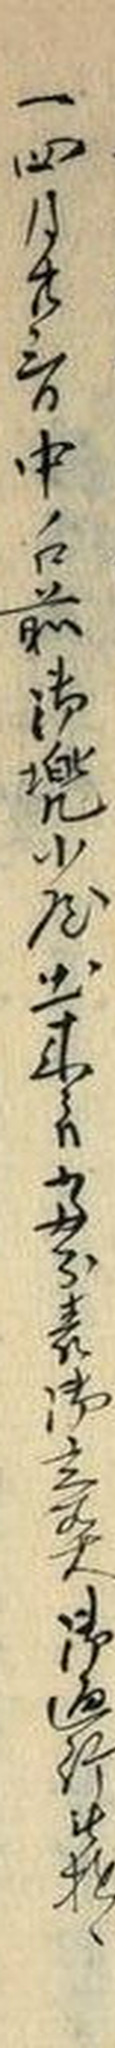一四月廿三日中ノ口前御兜小屋出来候付当分表御玄関御通行被遊候
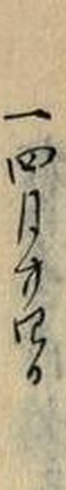一四月廿四日
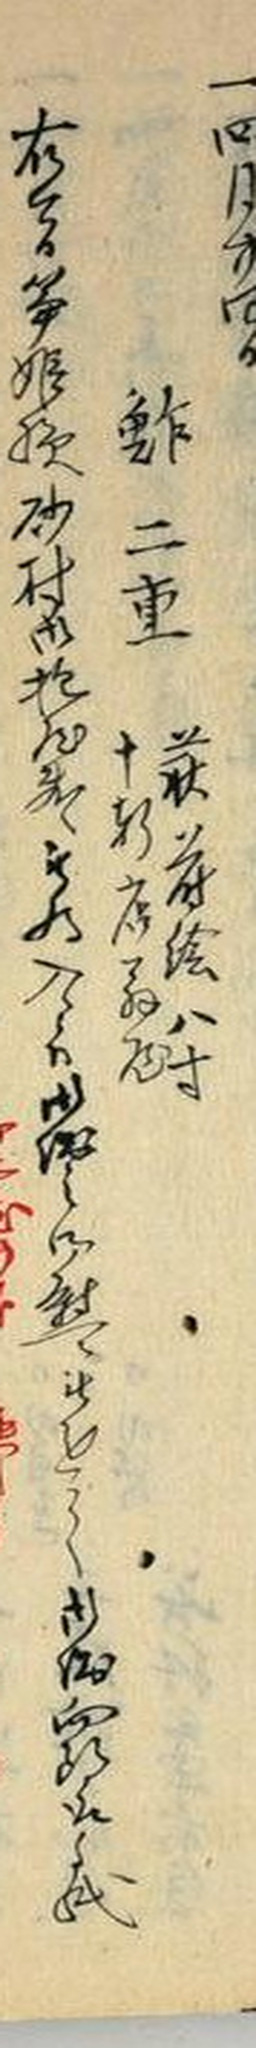右今日箏姫様砂村御抱屋敷へ被為入候ニ付御側之御慰ニ被進之御側向頭取手紙
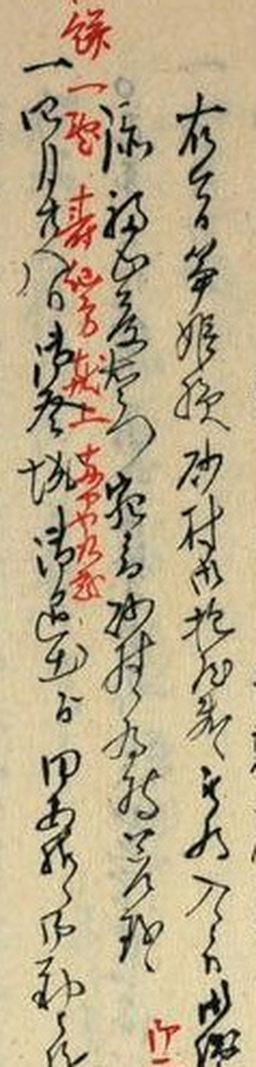添福山藤右衛門宛ニ而砂村へ為持差越候
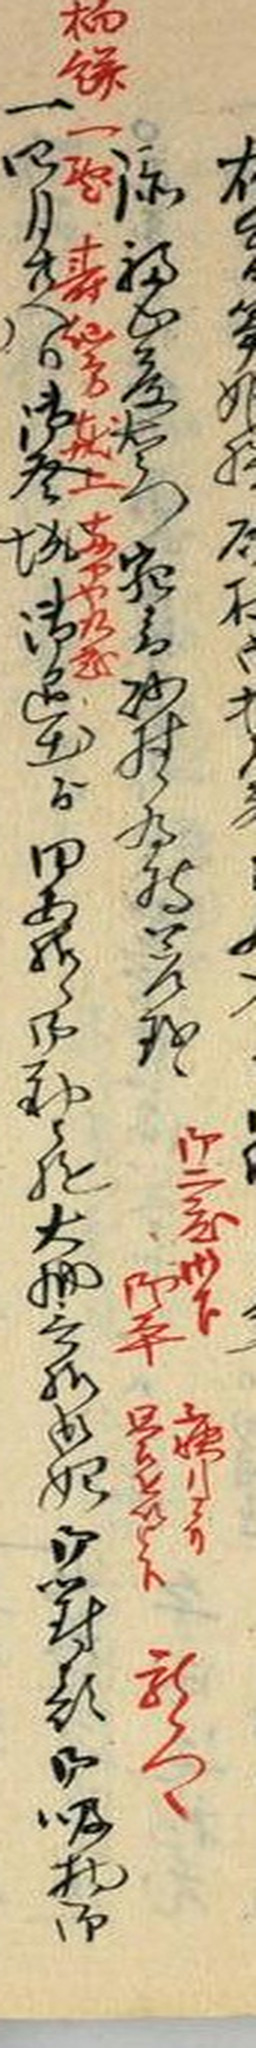一四月廿八日御登城御退出ゟ田安様へ御勤被遊大納言様御始御対顔御吸物御
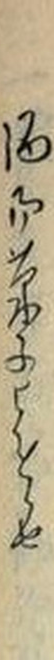酒御菓子被進候由
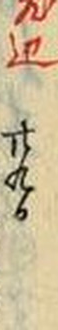廿九日
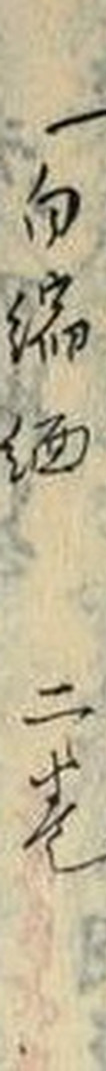白縮緬二巻
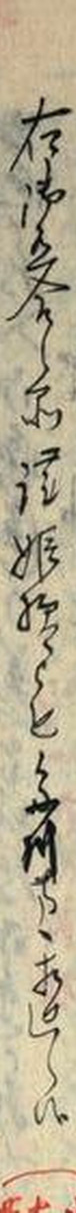右御有合之品謹姫様へ被進多川方へ相廻し候
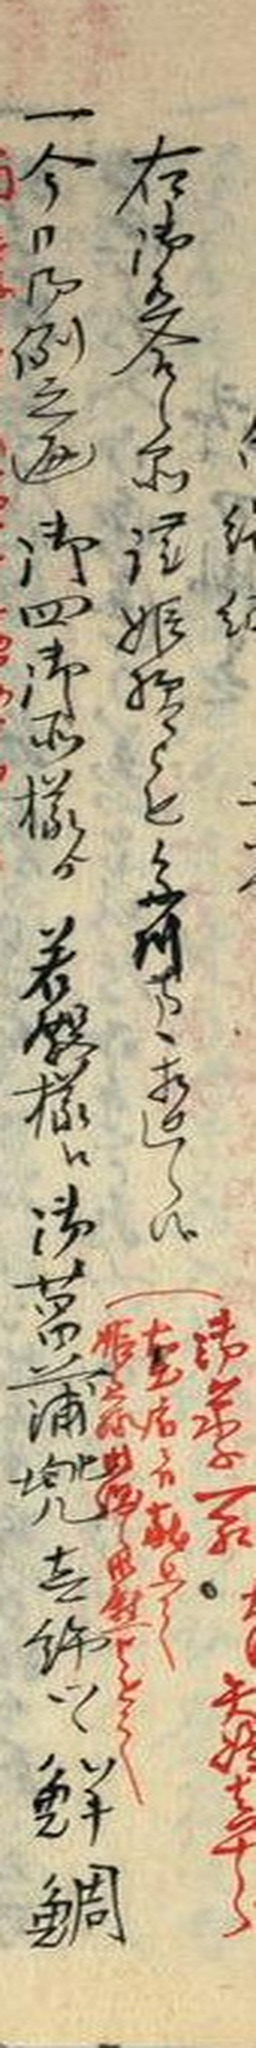一今日御例之通御四御所様ゟ若殿様江御菖蒲兜壱飾ツヽ鮮鯛
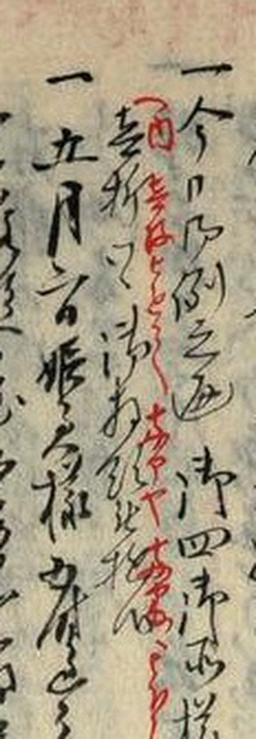壱折ツヽ御拝領被遊候
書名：少傅日録抄（斉承付側向頭取日記、在府）
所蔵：福井県文書館 Fukui Prefectural Archives
